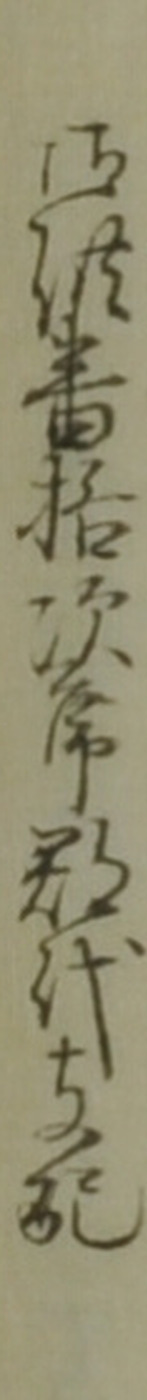御供番格次席郡代支配
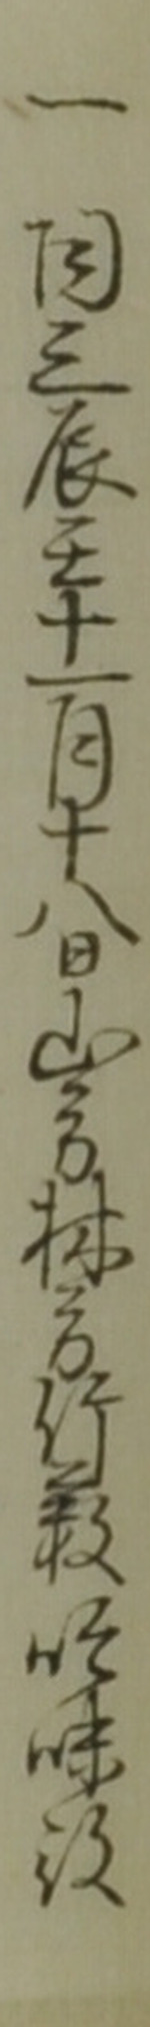一同三辰閏十一月十八日山方林方竹薮吟味役
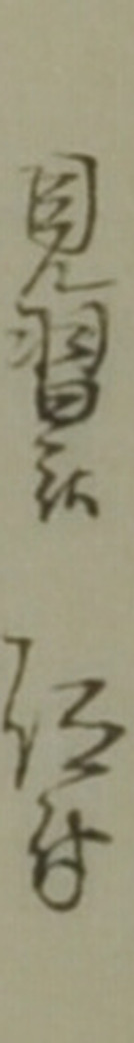見習被仰付
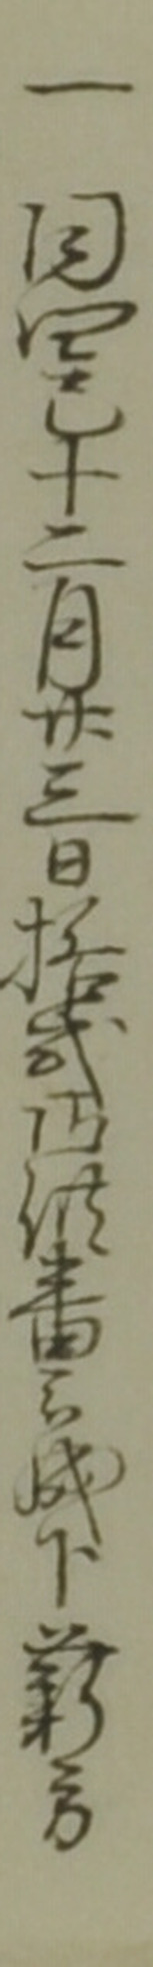一同四巳十二月廿三日格式御供番被成下薪方
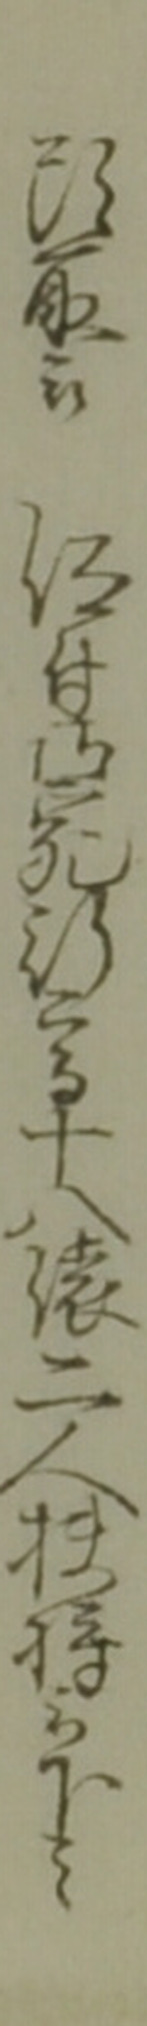頭取被仰付御宛行高十八俵二人扶持被下之
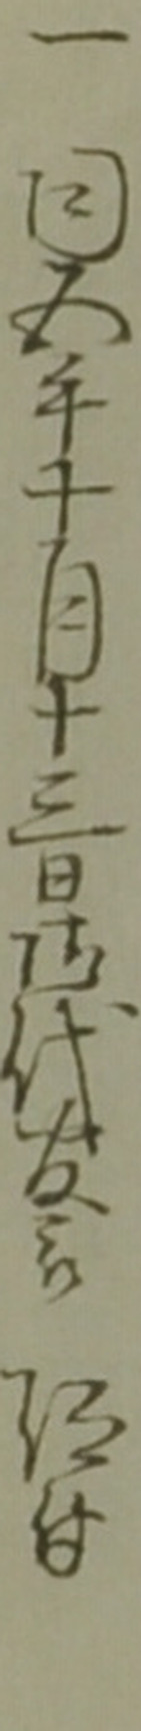一同五午十月十三日御代官被仰付
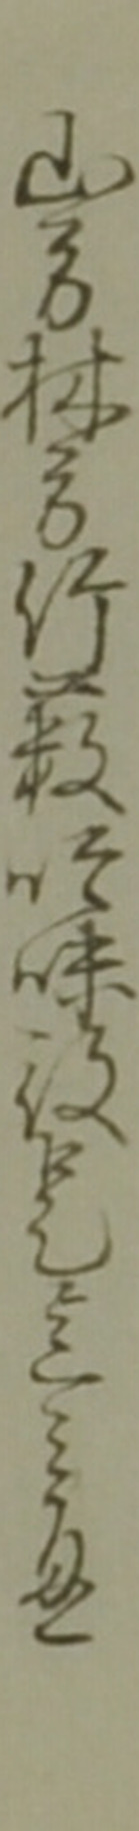山方林方竹薮吟味役是迄之通
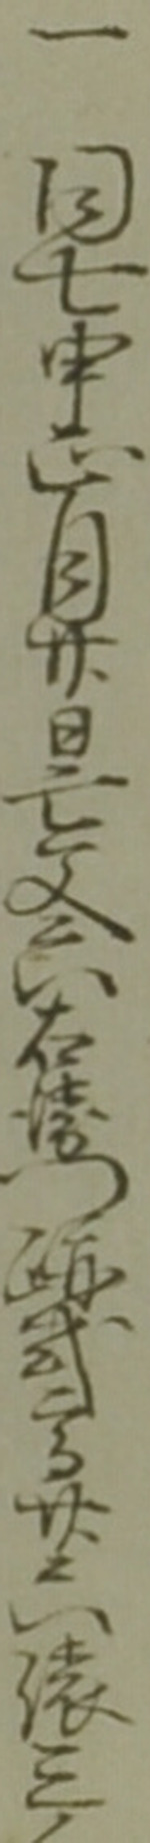一同七申正月廿日亡父六右衛門跡式高廿六俵三人
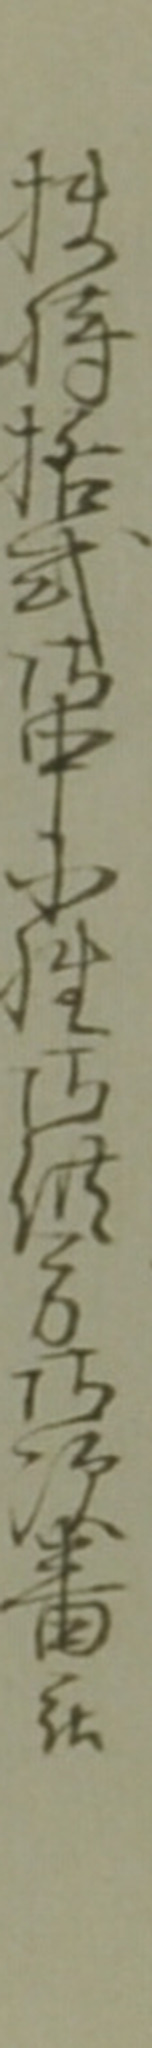扶持格式御中小性御供方御次番被
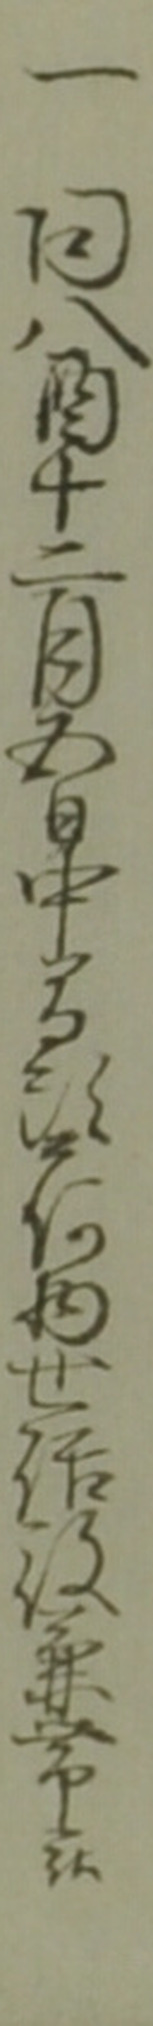一同八酉十二月五日中間頭荷物世話役兼帯被
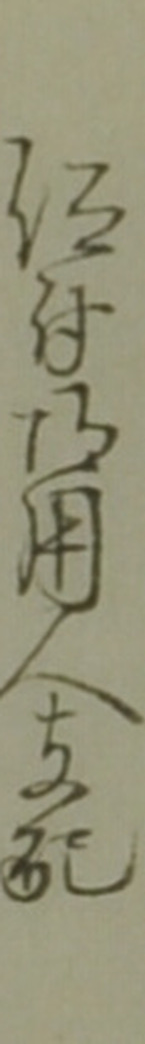仰付御用人支配
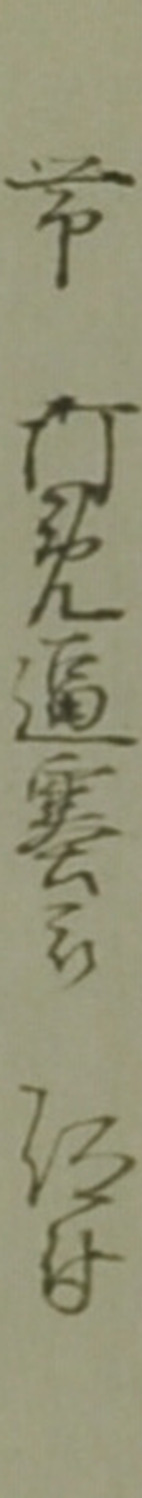帯御免逼塞被仰付
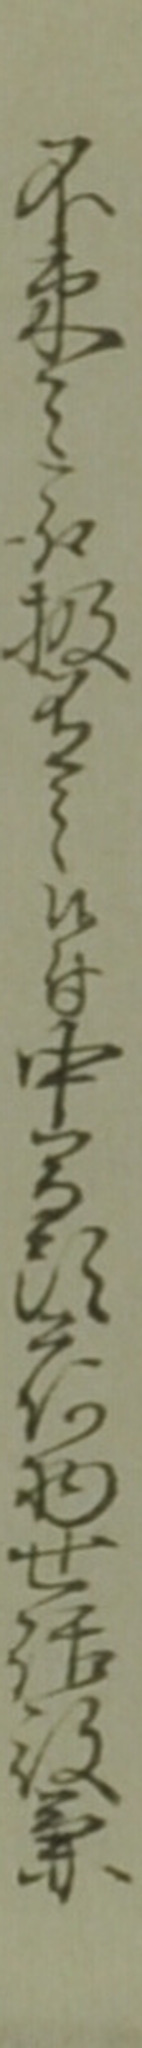不束之取扱有之候付中間頭荷物世話役兼
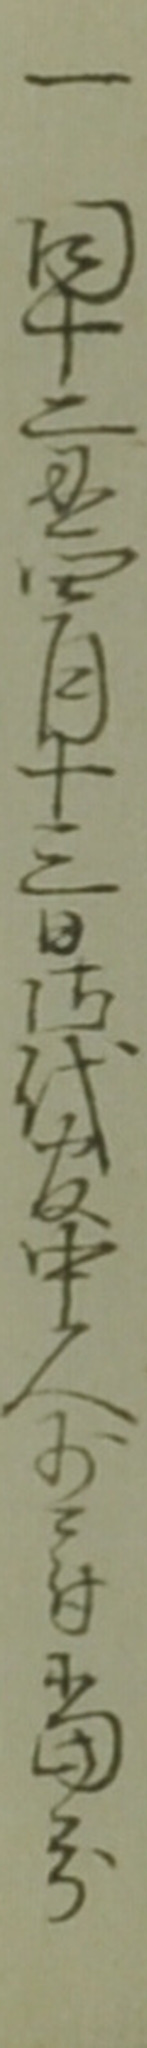一同十二丑四月十三日御代官中人少ニ付当分
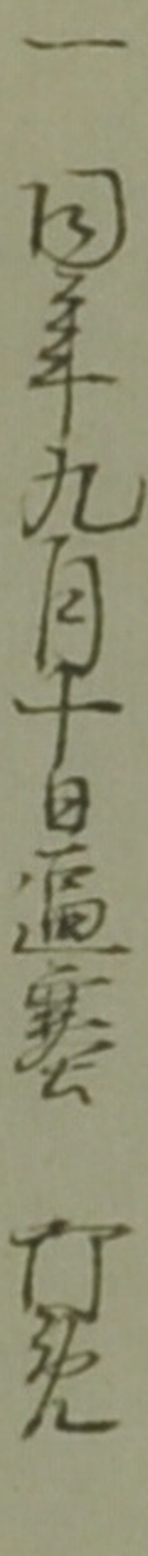一同年九月十日逼塞御免
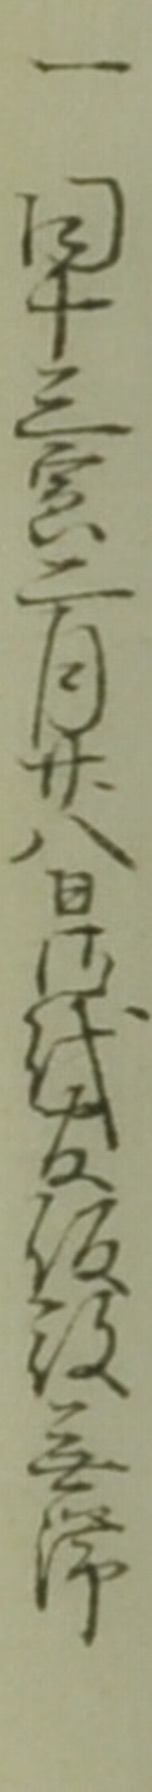一同十三寅二月廿八日御代官仮役無滞
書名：無足諸士勤仕録（一）
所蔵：伊那市立高遠町図書館・合同会社AMANE
